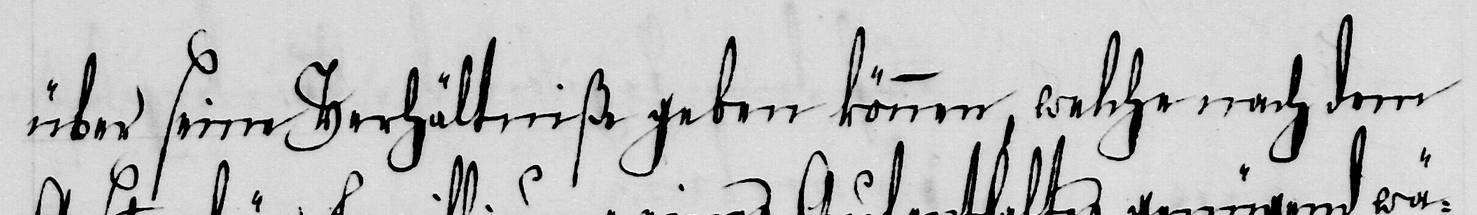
über seine Verhältniße geben können, welche nach dem
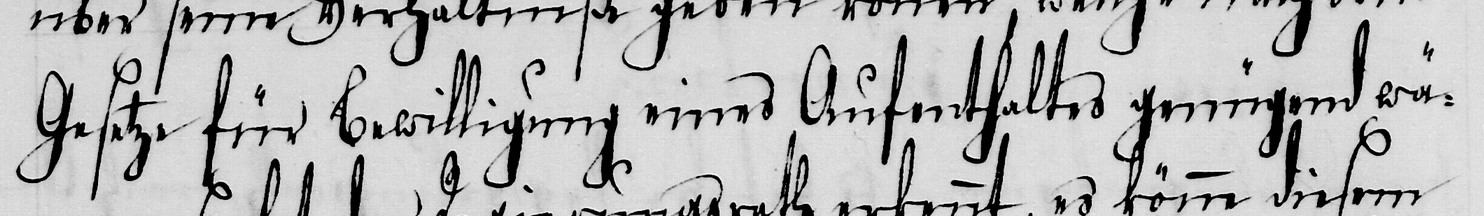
Gesetze für Bewilligung eines Aufenthaltes genügend wä¬
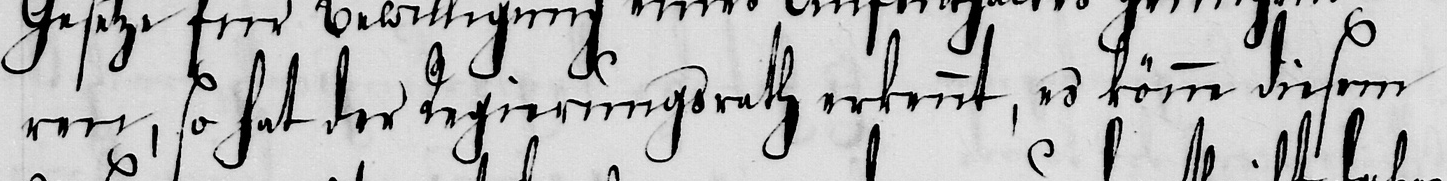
ren, so hat der Regierungsrath erkennt, es könne diesem
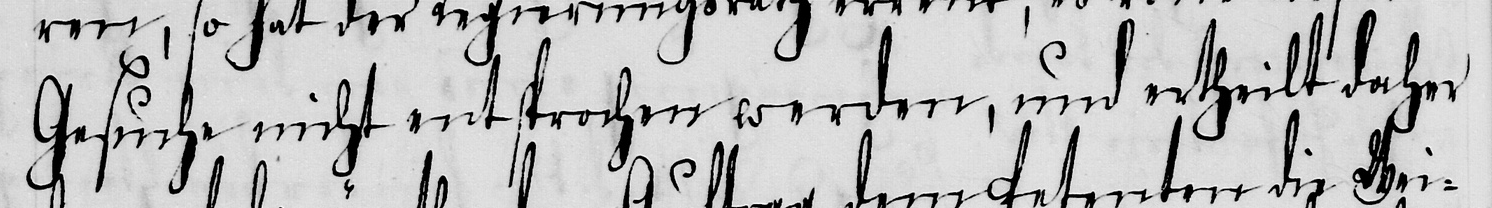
Gesuche nicht entsprochen werden, und ertheilt daher
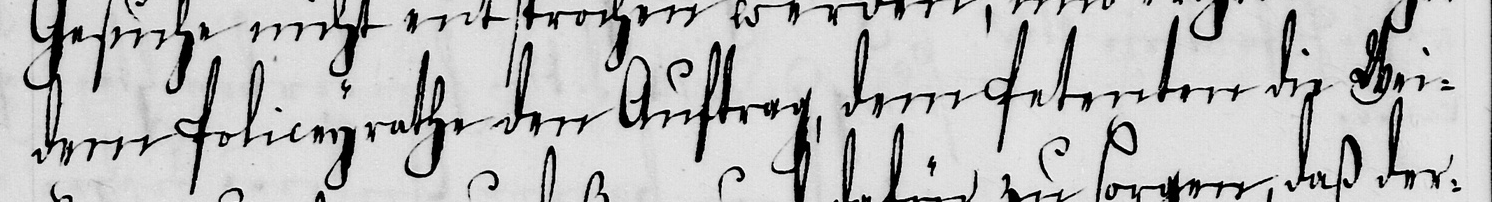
dem Policeyrathe den Auftrag, dem Petenten die Wei¬
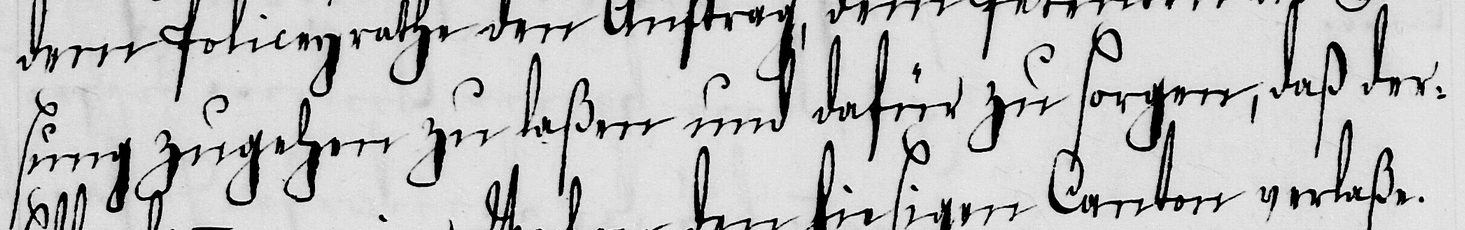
sung zugehen zu laßen und dafür zu sorgen, daß der¬
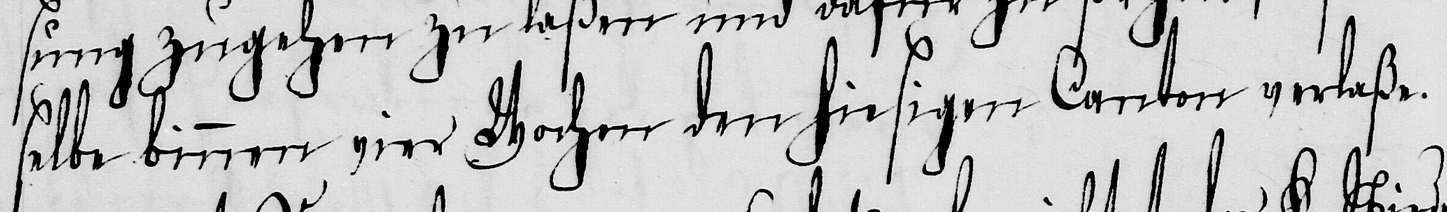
selbe binnen vier Wochen den hiesigen Canton verlaße.
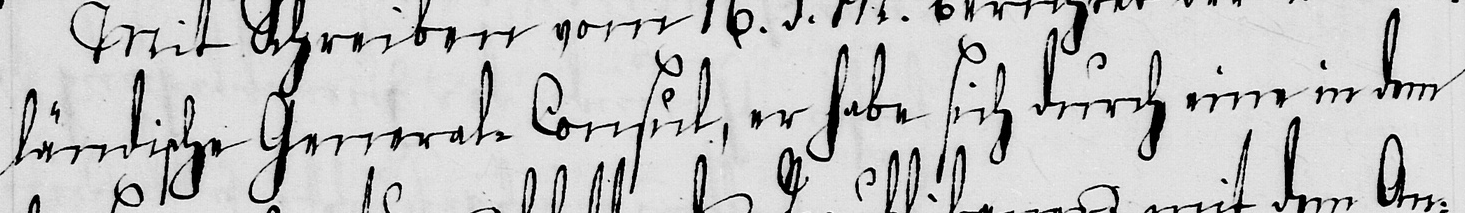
ländische General-Consul, er habe sich durch eine in dem
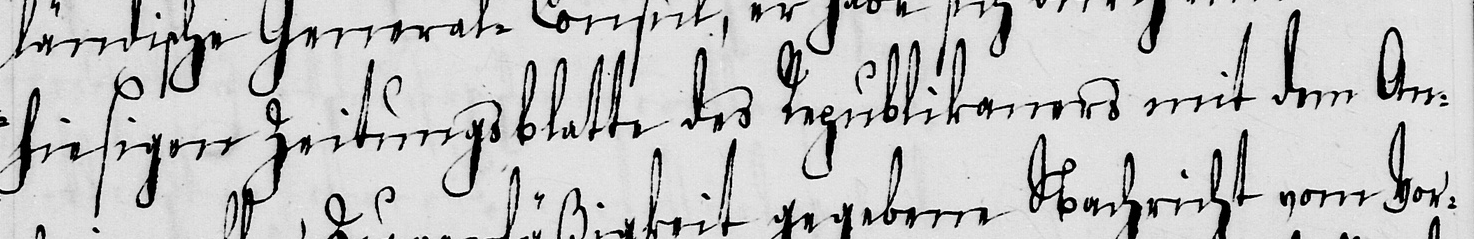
hiesigen Zeitungsblatte des Republikaners mit dem Ans¬
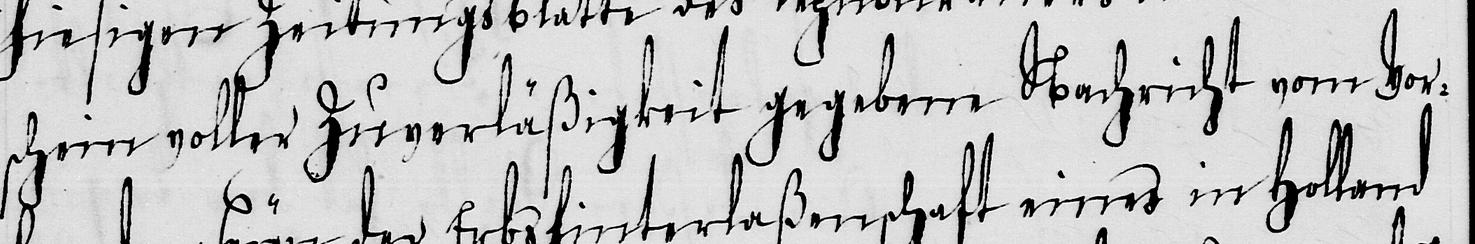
chein voller Zuverläßigkeit gegebene Nachricht vom Vor¬
